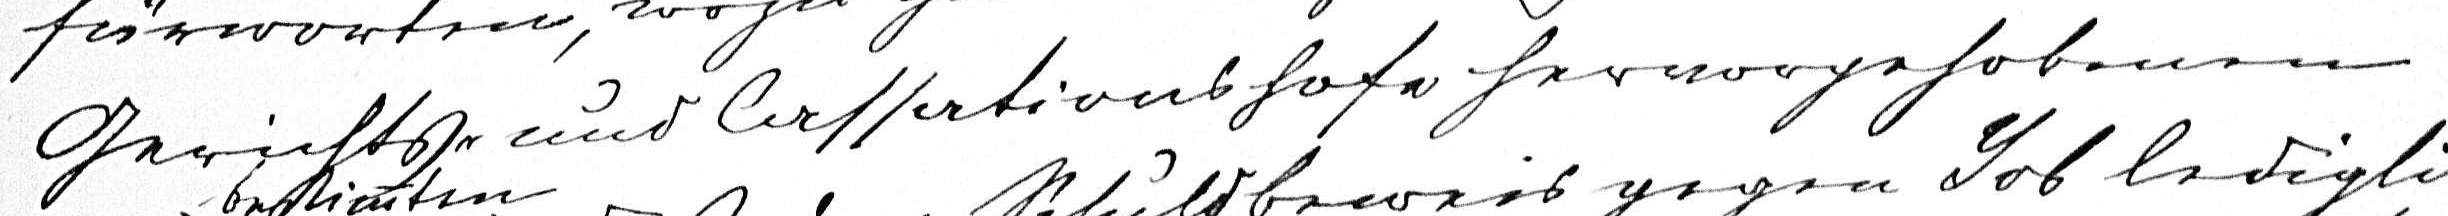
Gerichts- und Cassationshofe hervorgehobenen
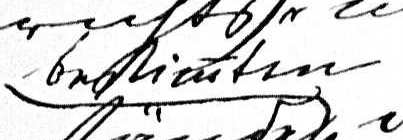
bestimmten
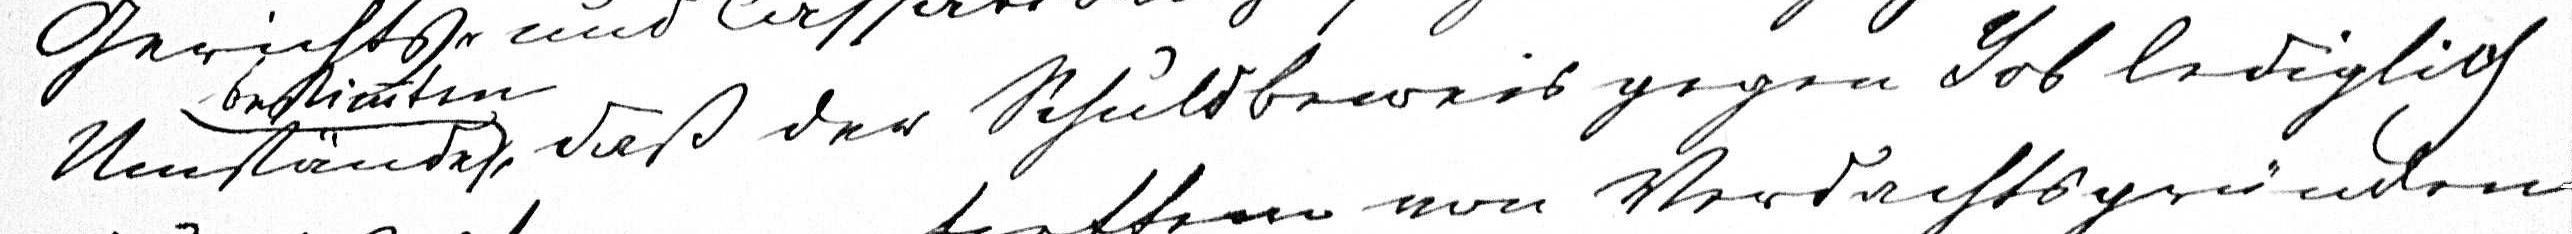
Umstände, daß der Schuldbeweis gegen Job lediglich
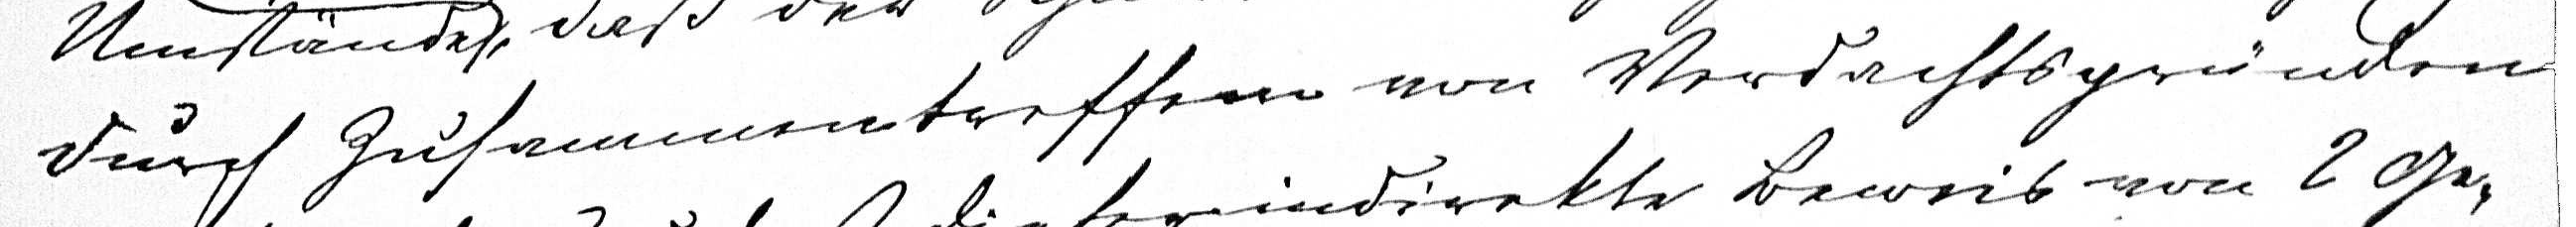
durch Zusammentreffen von Verdachtsgründen
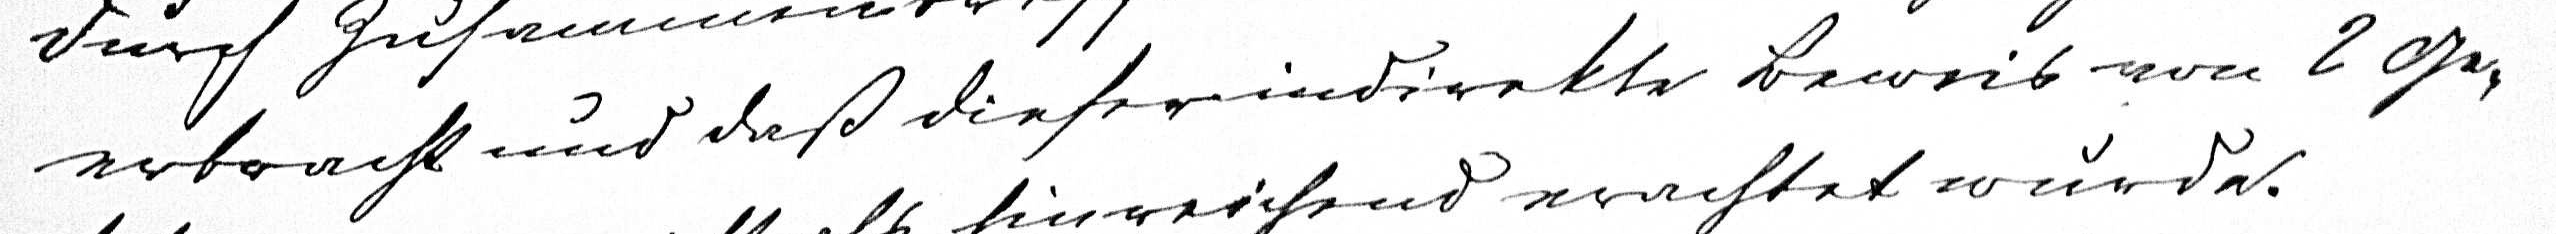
erbracht und daß dieser indirekte Beweis von 2 Ge¬
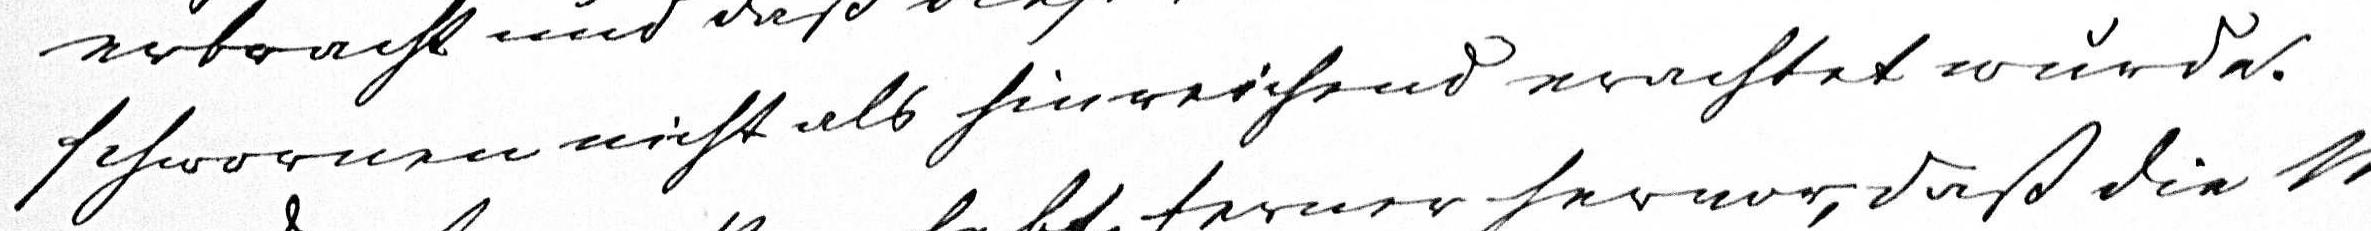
schworenen nicht als hinreichen erachtet wurde.
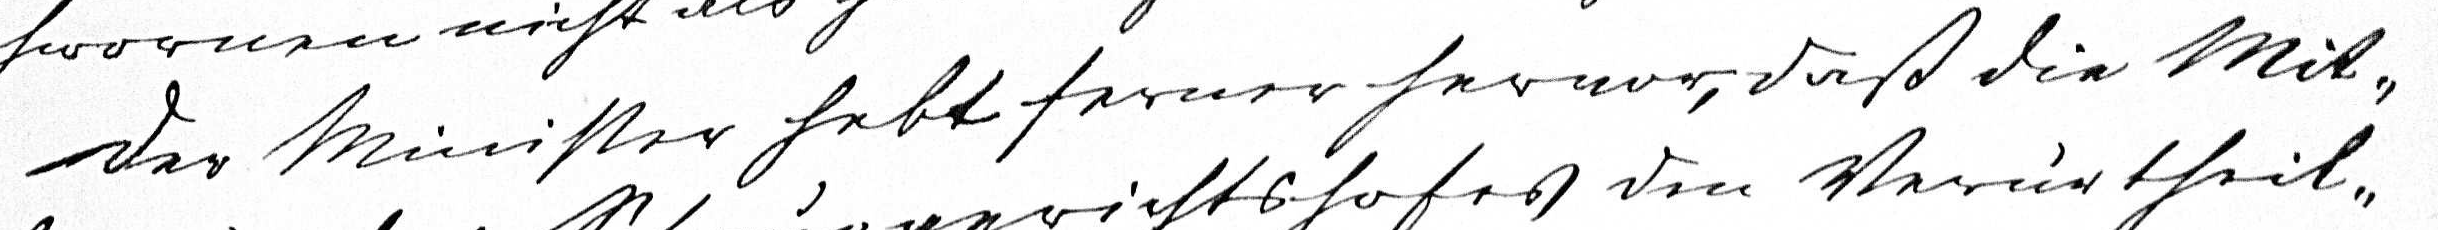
Der Minister hebt ferner hervor, daß die Mit¬
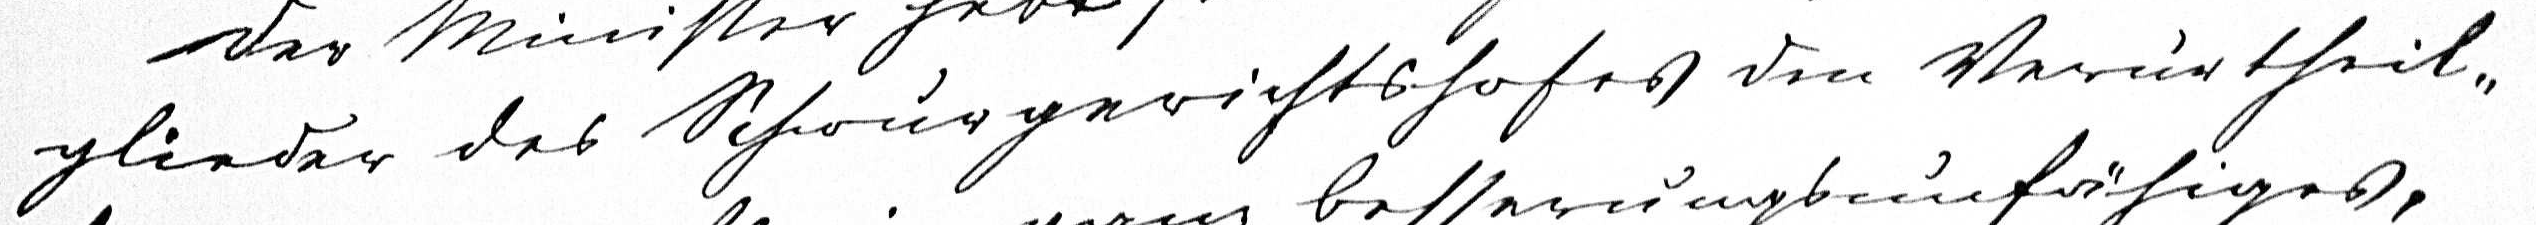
glieder des Schwurgerichtshofes den Verurtheil¬
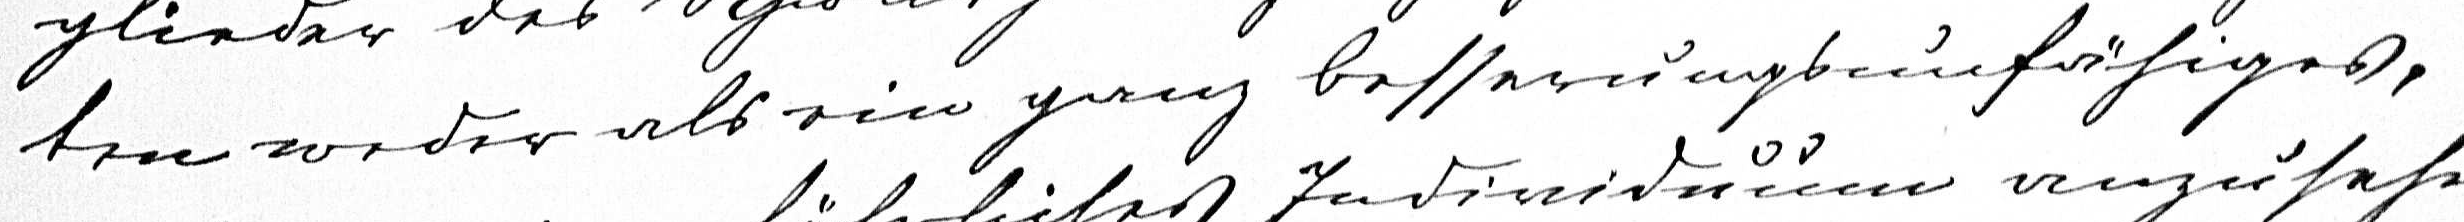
ten weder als ein ganz besserungsunfähiges,
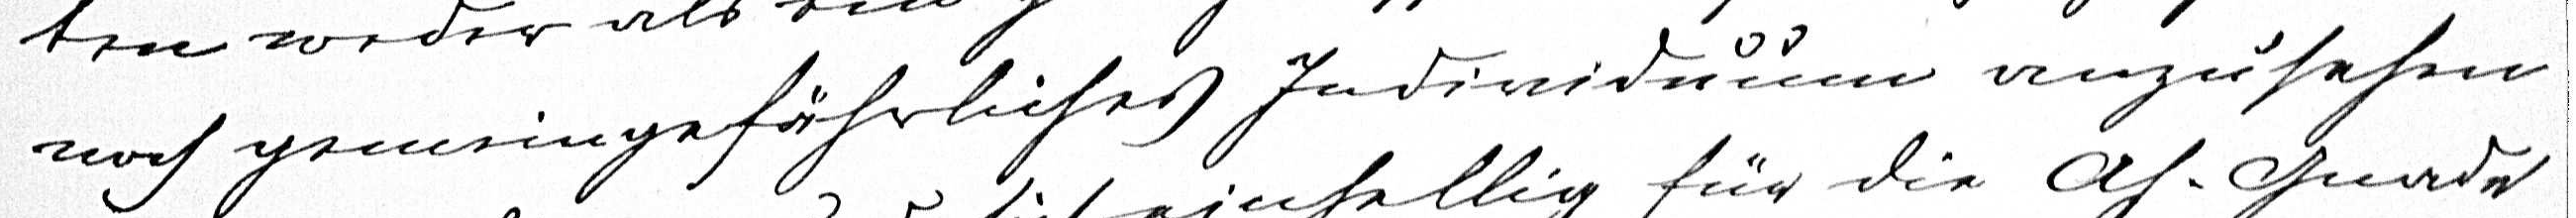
noch gemeingefährliches Individuum anzusehen
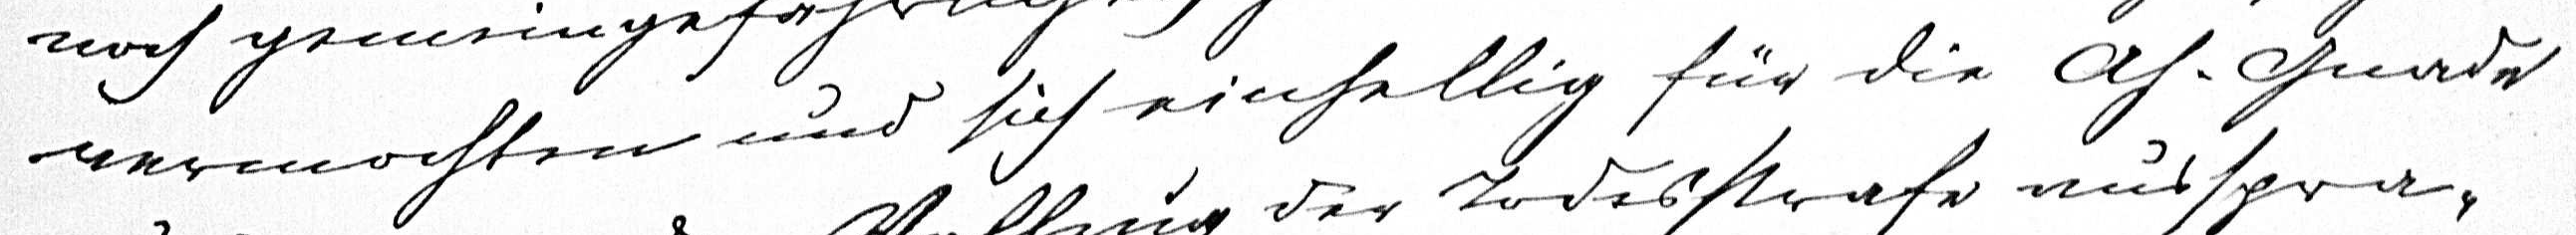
vermochten und sich einhellig für die Ah. Gnade
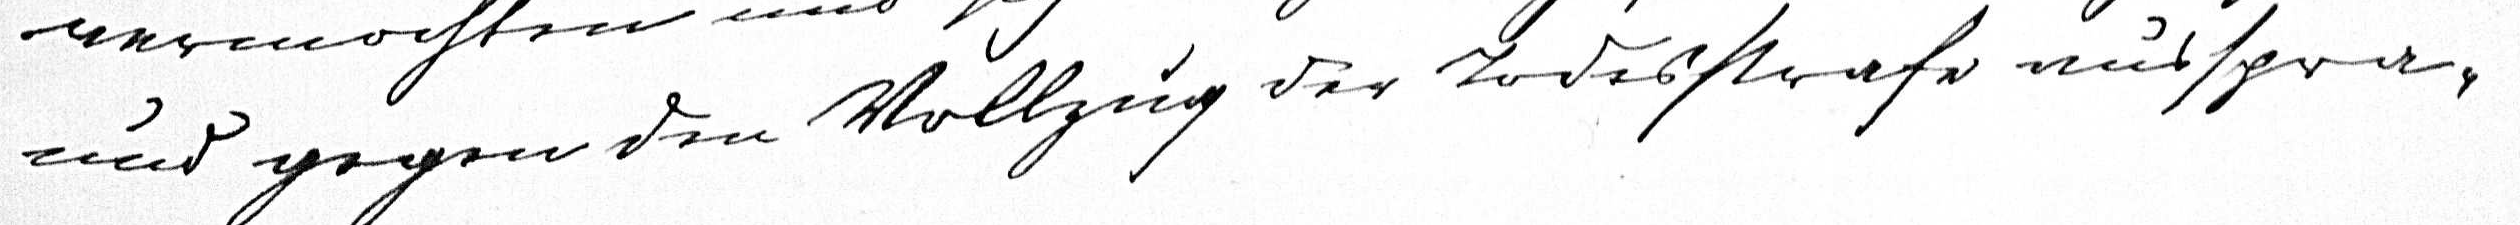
und gegen den Vollzug der Todesstrafe auspra¬
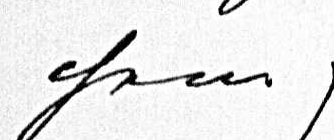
chen.
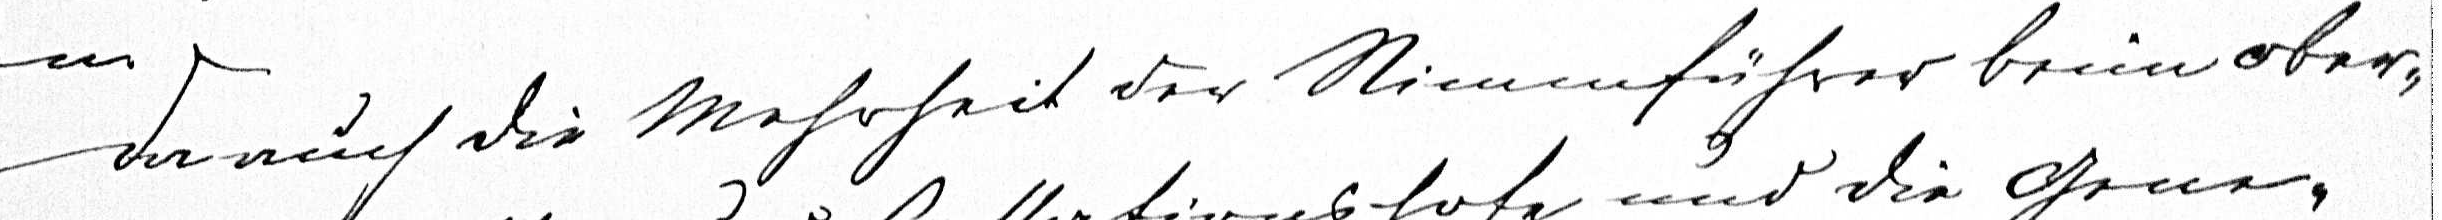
Da auch die Mehrheit der Stimmführer beim ober¬
